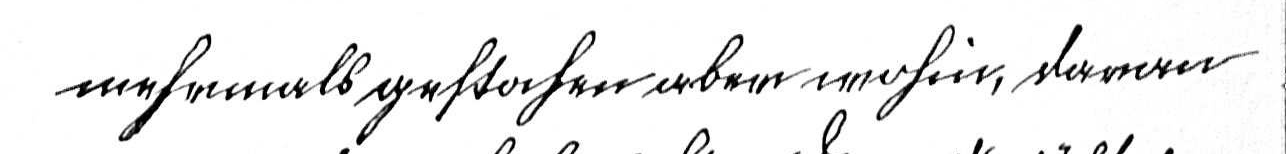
mehrmals gestochen aber wohin, daran
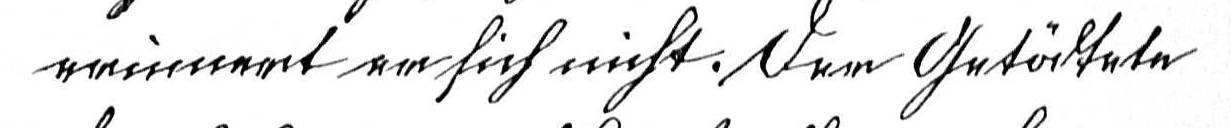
erinnert er sich nicht. Der Getödtete
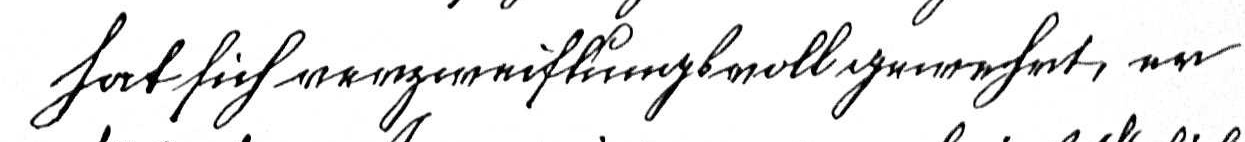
hat sich verzweiflungsvoll gewehrt, er
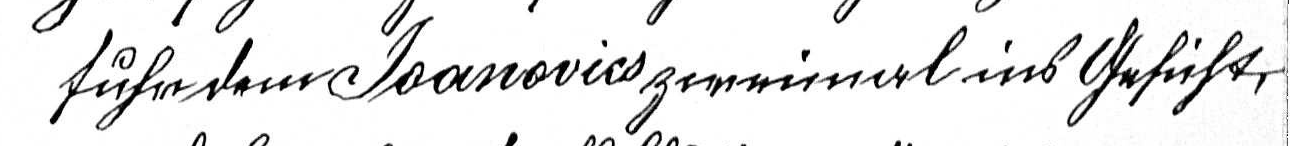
fuhr dem Ioanovics zweimal ins Gesicht,
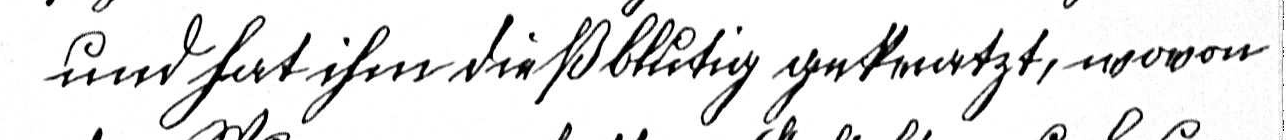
und hat ihm dieß blutig gekratzt, wovon
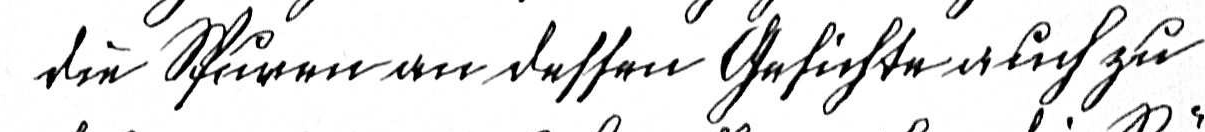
die Spuren an dessen Gesichte auch zu
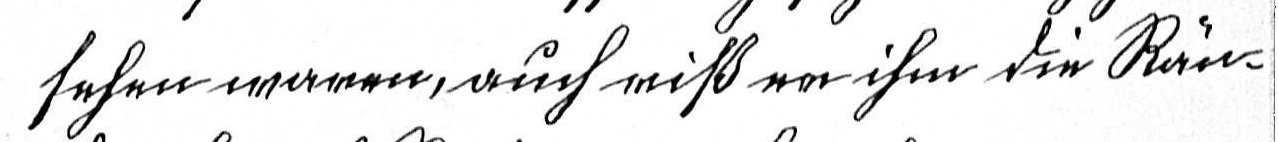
sehen waren, auch riß er ihm die Rän¬
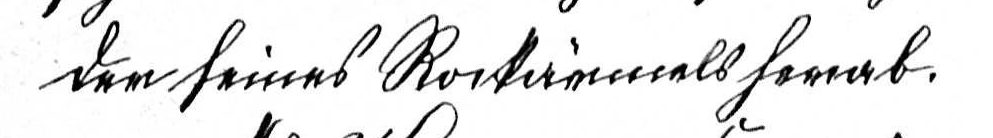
der seines Rockärmels herab.
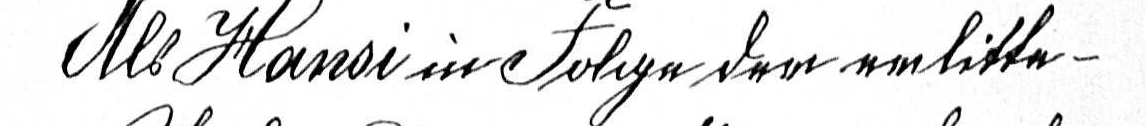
Als Hansi in Folge der erlitte¬
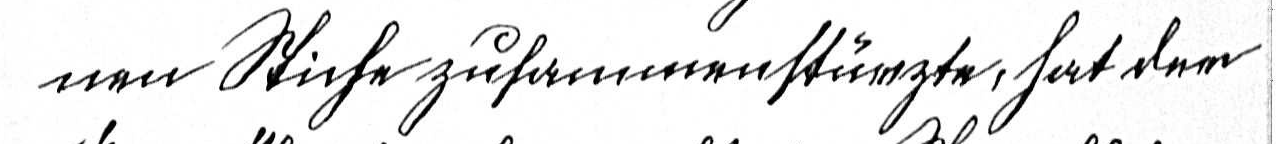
nen Stiche zusammenstürzte, hat der
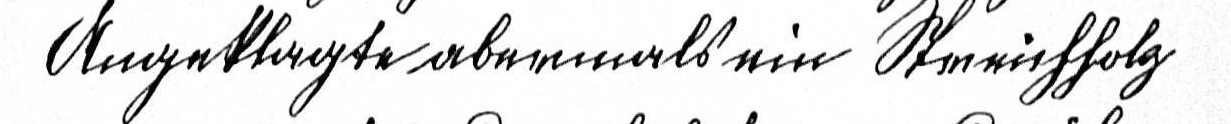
Angeklagte abermals ein Streichholz
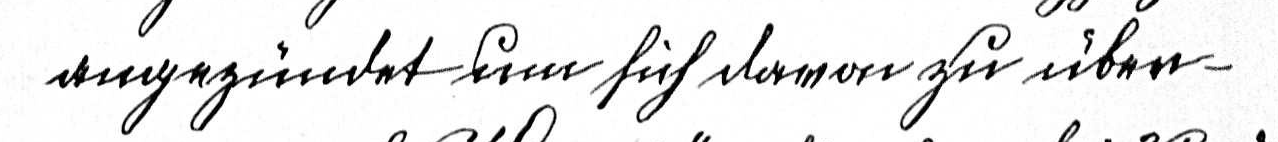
angezündet um sich davon zu über¬
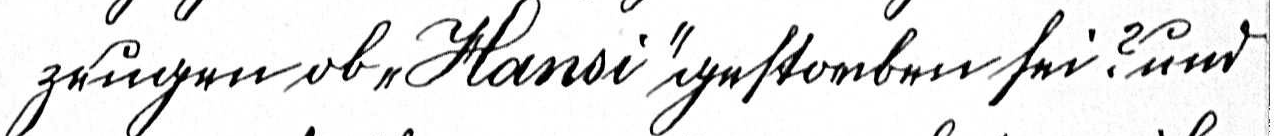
zeugen ob „Hansi“ gestorben sei? Und
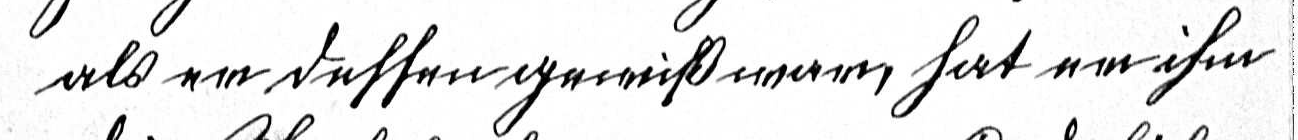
als er dessen gewiß war, hat er ihm
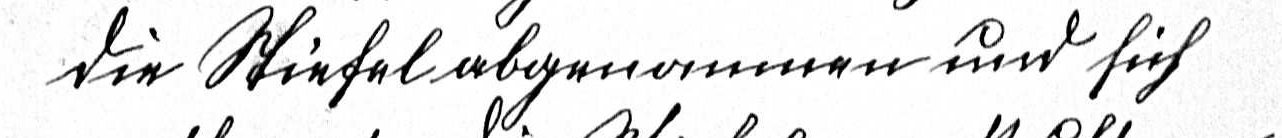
die Stiefel abgenommen und sich
